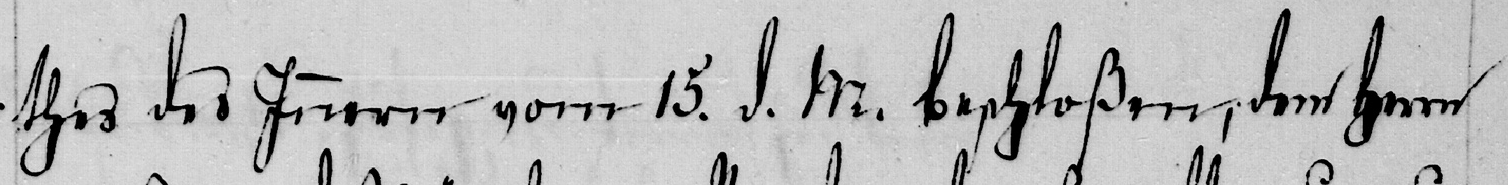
thes des Innern vom 15. d. M. beschloßen, dem Herrn
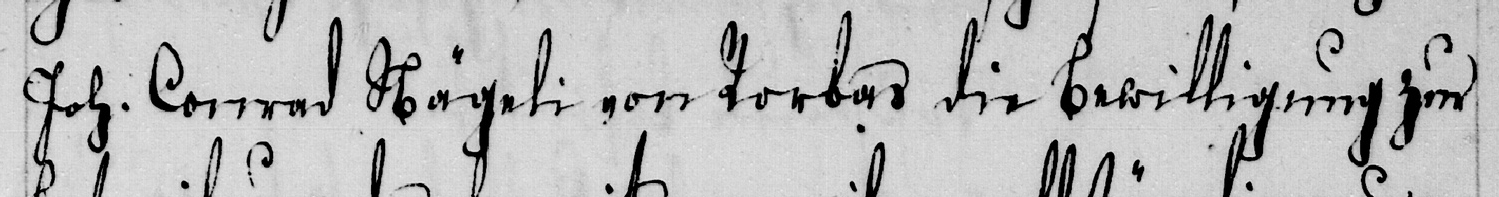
Joh. Conrad Nägeli von Rorbas die Bewilligung zur
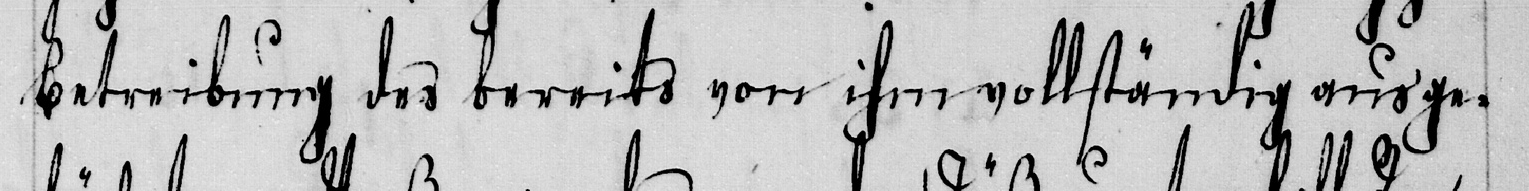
Betreibung des bereits von ihm vollständig ausge¬
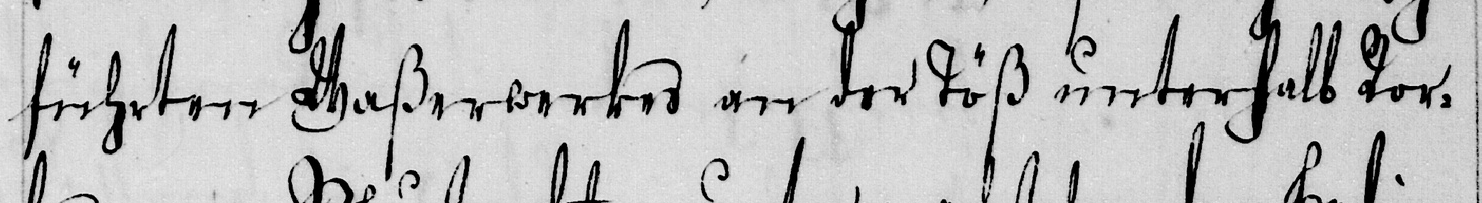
führten Waßerwerkes an der Töß unterhalb Ror¬
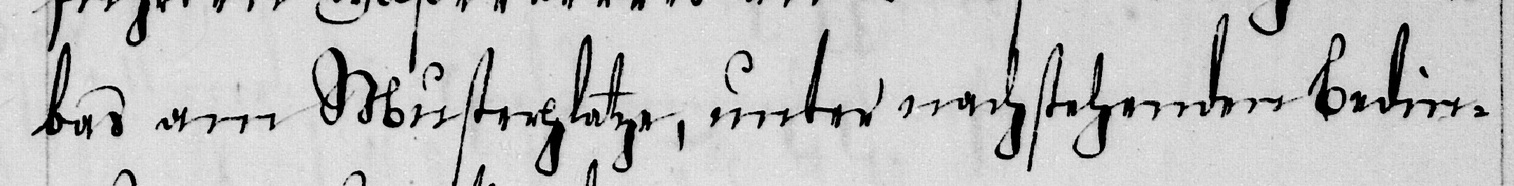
bas am Musterplatze, unter nachstehenden Bedin¬
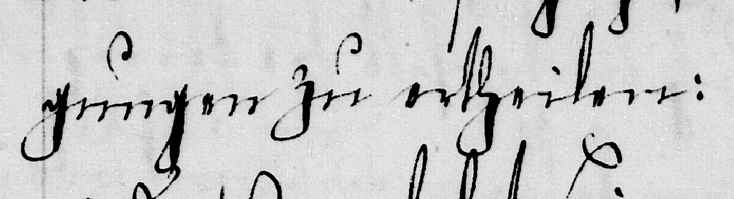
gungen zu ertheilen:
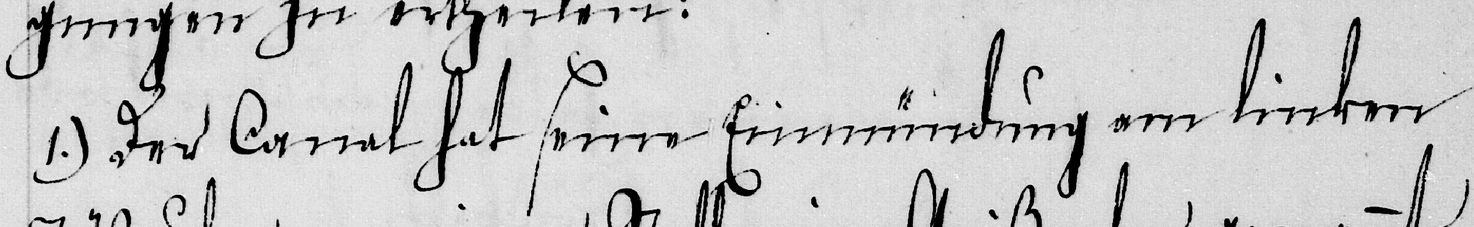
1.) Der Canal hat seine Einmündung am linken
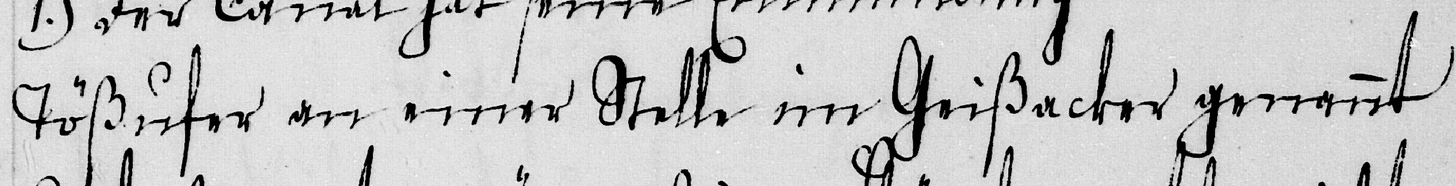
Tößufer an einer Stelle im Geißacker genannt
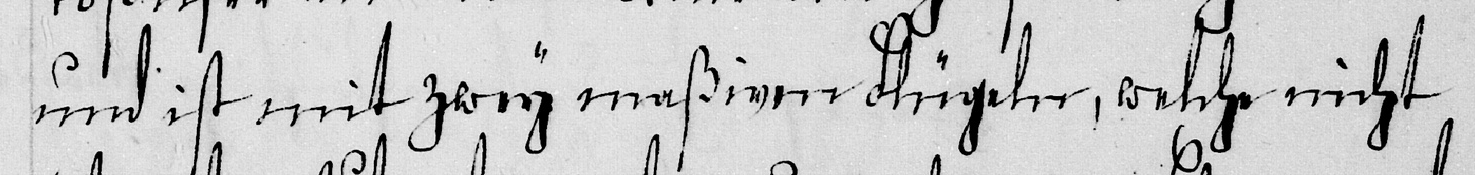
und ist mit zwey maßiven Flügeln, welche nicht
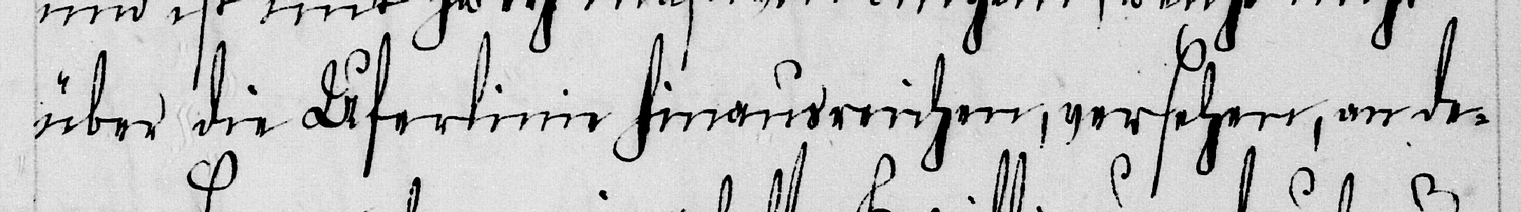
über die Uferlinie hinausreichen, versehen, an de¬
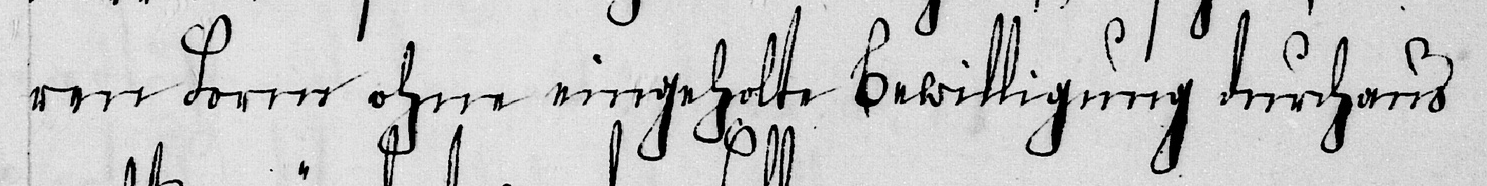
ren Form ohne eingeholte Bewilligung durchaus
